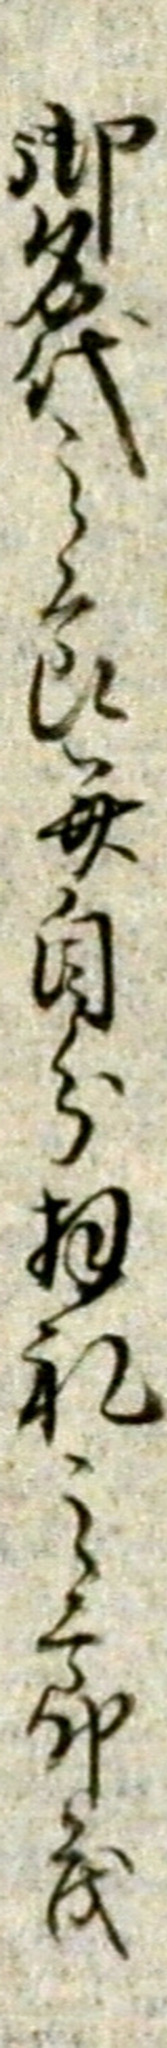御名代之節幷自分拝礼之節も
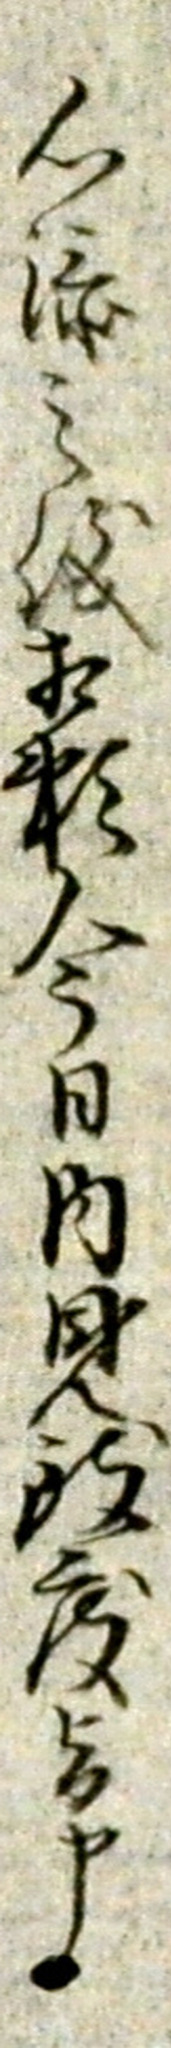心添之儀相頼今日内見致度旨申
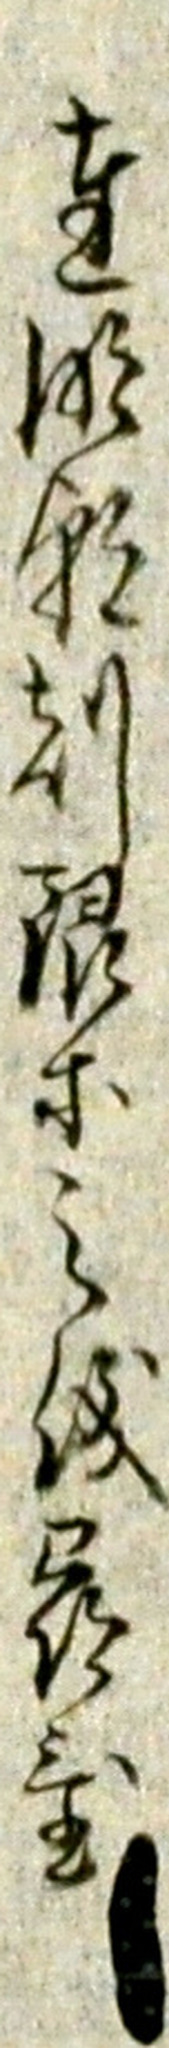達明朝刻限等之儀尋置
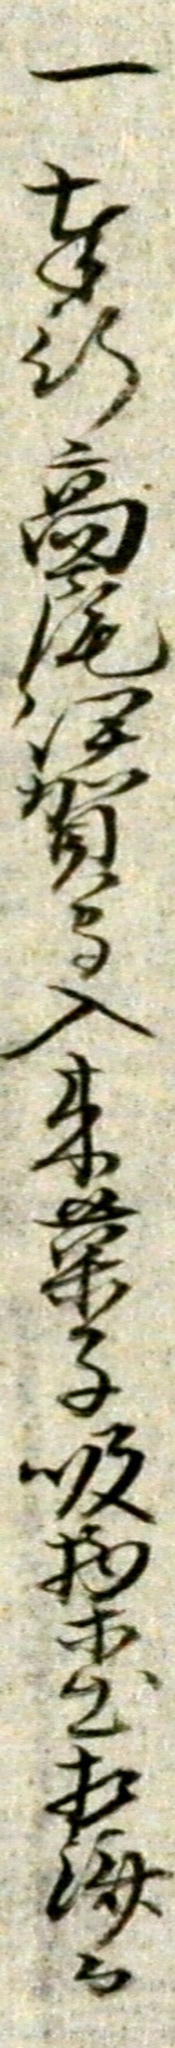一奉行高尾伊賀守入来菓子吸物等出相済而
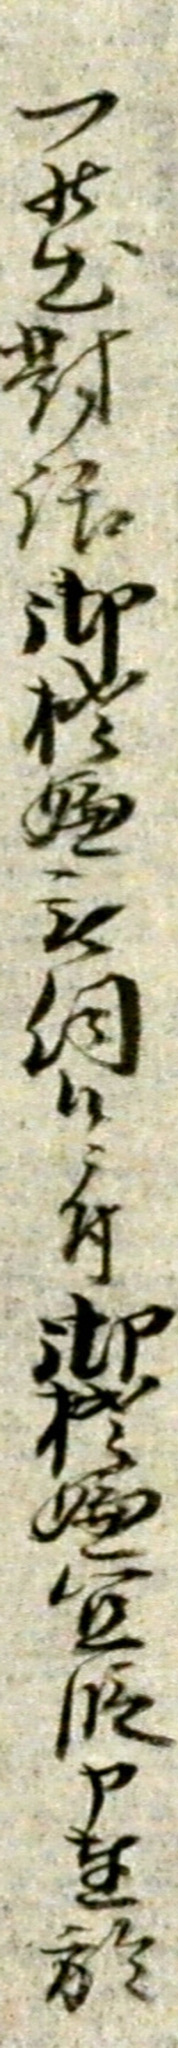罷出対話御機嫌被伺候ニ付御機嫌宜段申達於
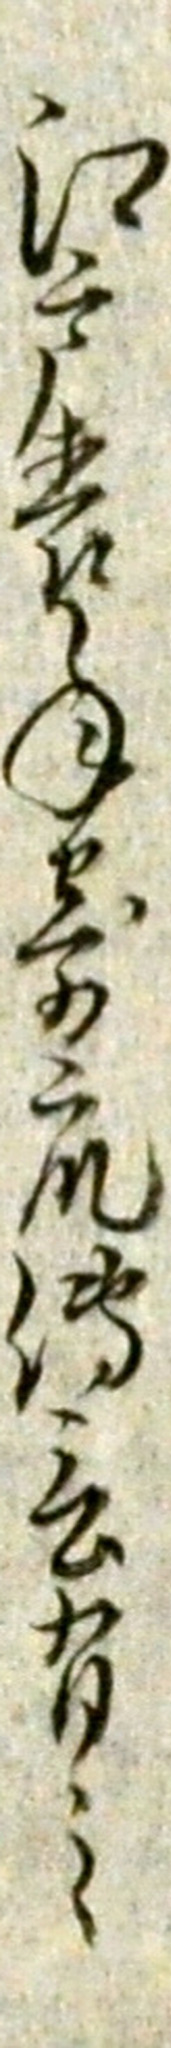江戸表年寄衆伝言有之
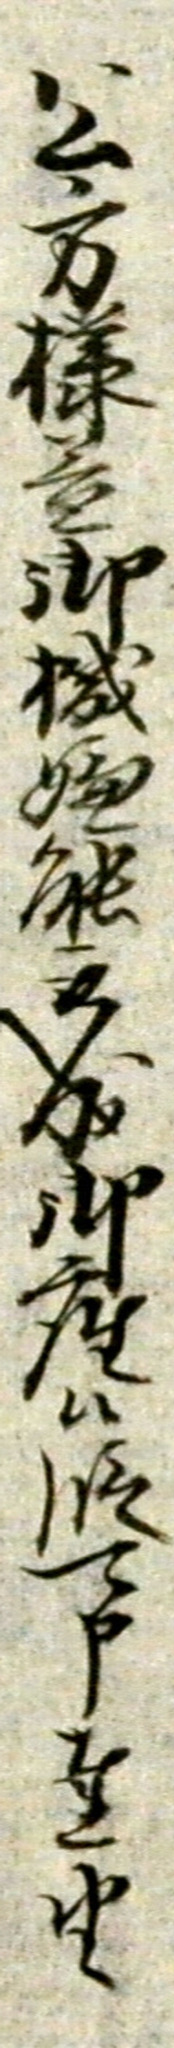公方様益御機嫌能被成御座候段可申達由
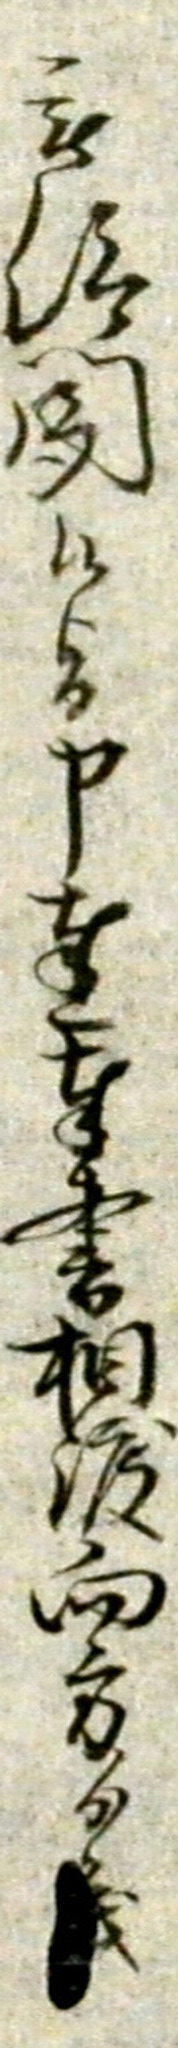被仰聞候旨申達奉書相渡向方ゟも
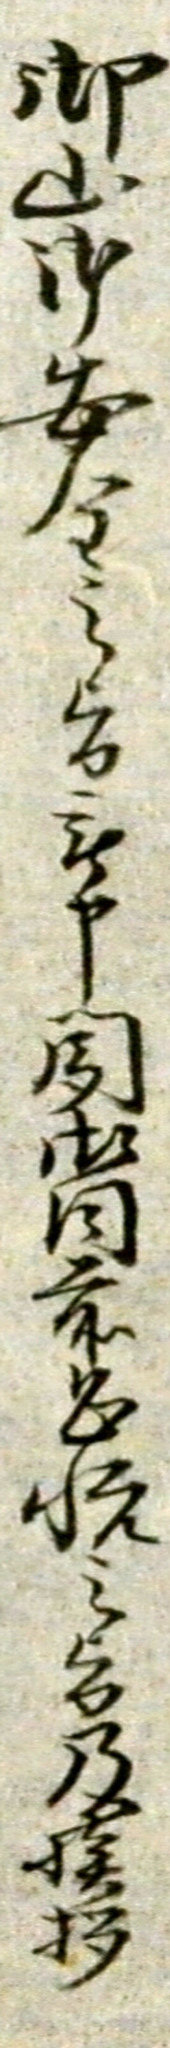御山御安全之旨被申聞御同前恐悦之旨及挨拶
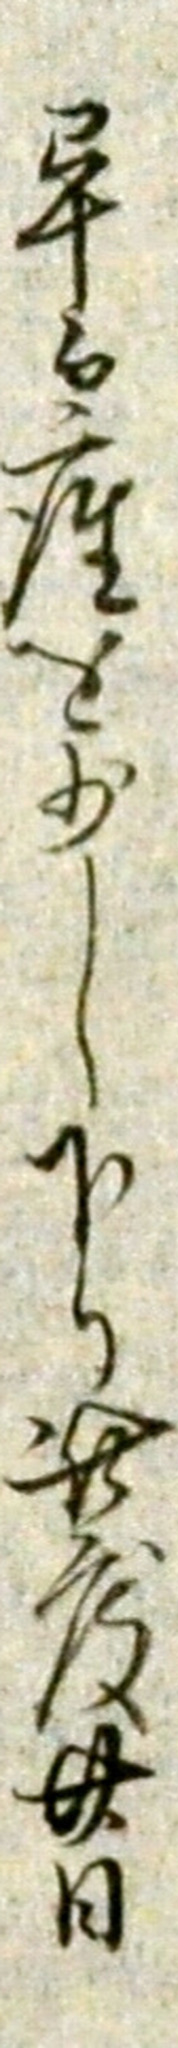畢而座を少し下り此度廿日
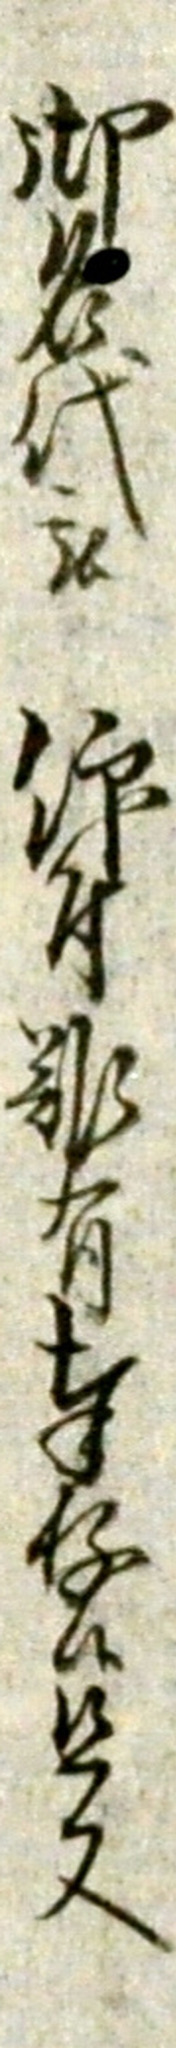御名代被仰付難有奉存候且又
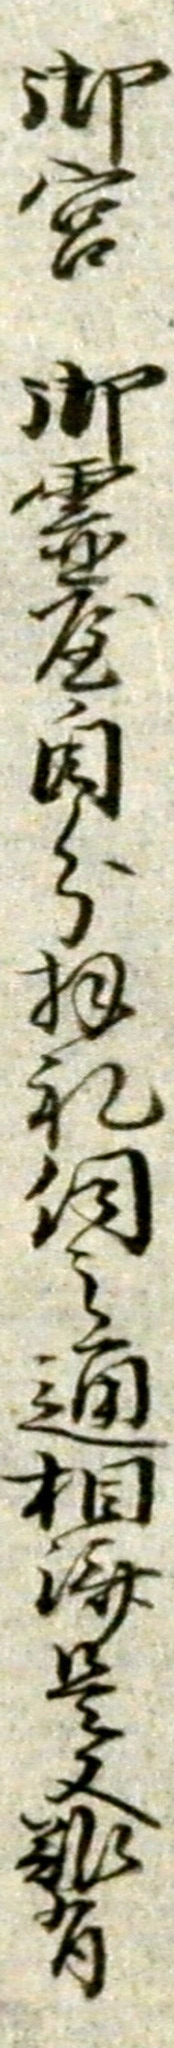御宮御霊屋自分拝礼伺之通相済是又難有

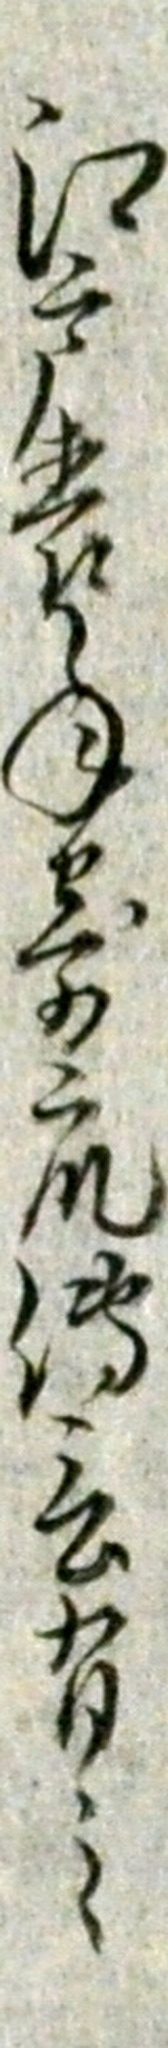江戸表年寄衆伝言有之
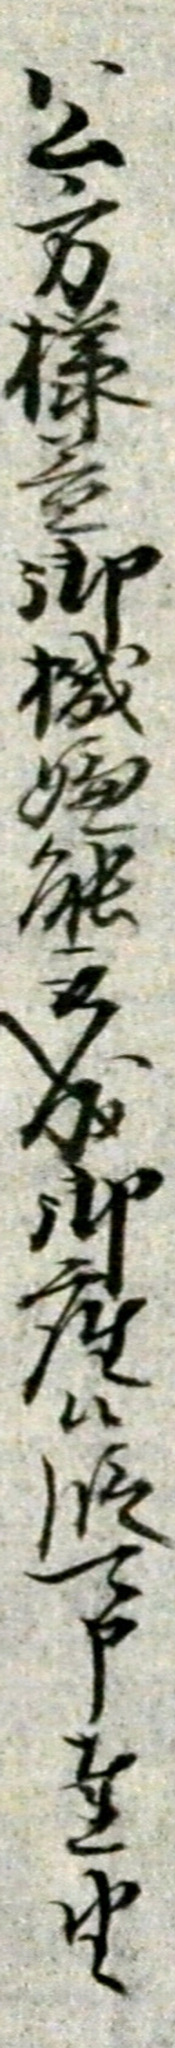公方様益御機嫌能被成御座候段可申達由ニ
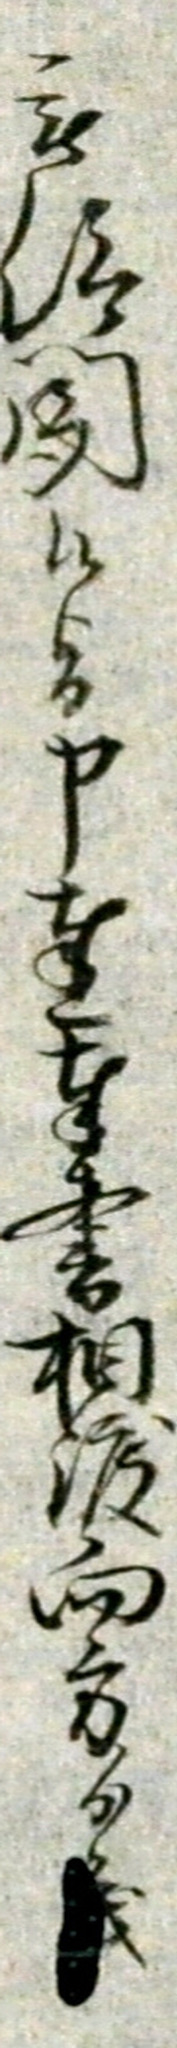被仰聞候旨申達奉書相渡向方ゟ茂
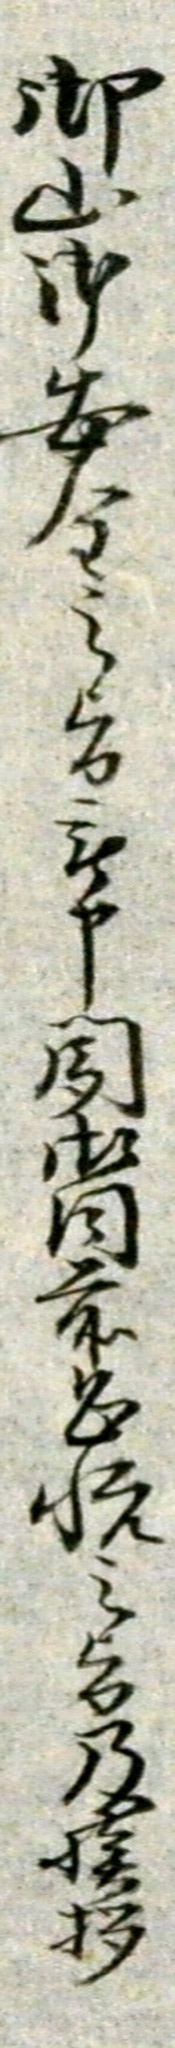御山御安全之旨被申聞御同前恐悦之旨及挨拶
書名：日光御名代相勤候節ノ留
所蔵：伊那市立高遠町図書館・合同会社AMANE
